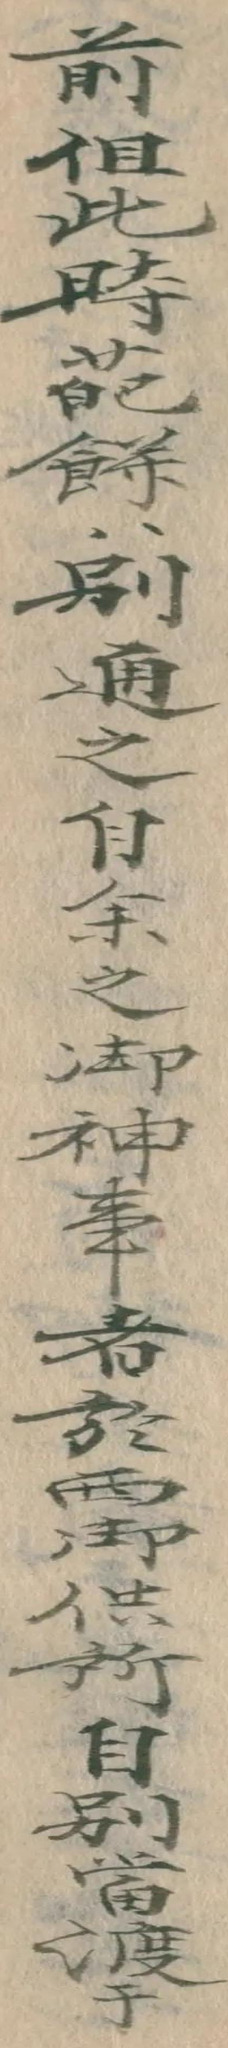前但此時葩餅ハ別通之自余之御神事者於西御供所自別当渡于
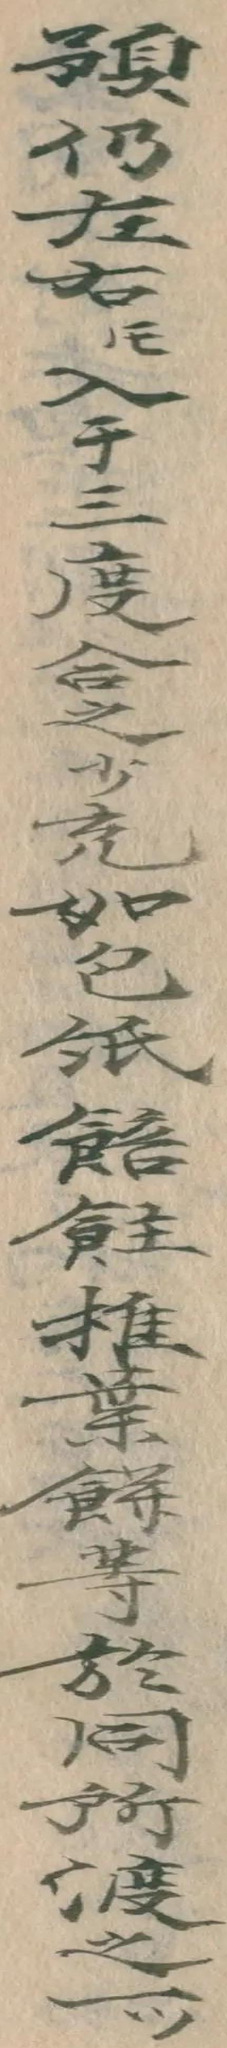預仍左右トモ入于三度合之少充如包紙餢飳椎葉餅等於同所渡之一ツ
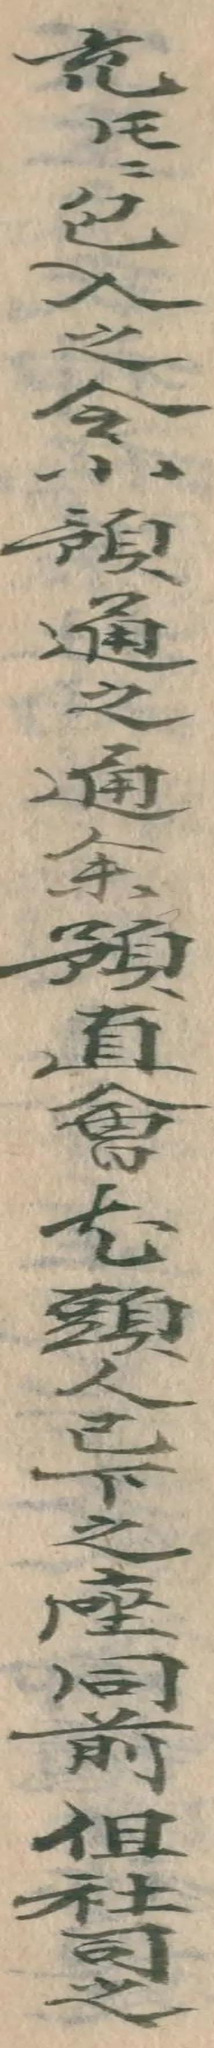充トモニ包入之令小預通之通余預直会尤頭人已下之座同前但社司之
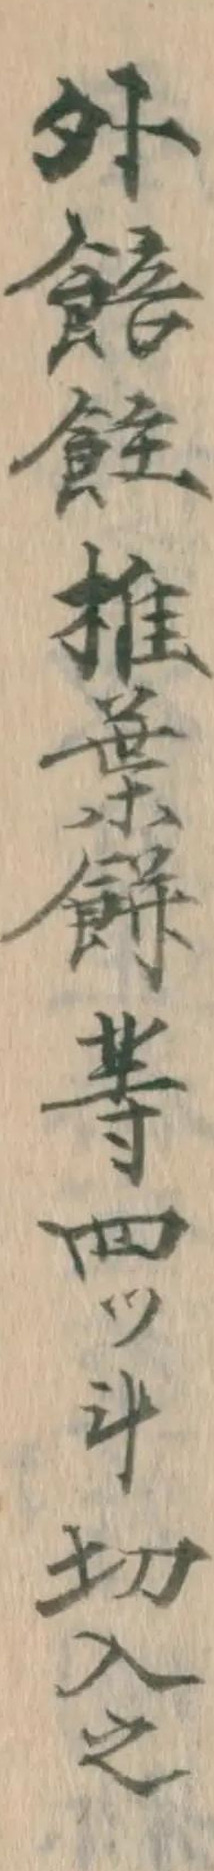外餢飳椎葉餅等四ツ計切入之
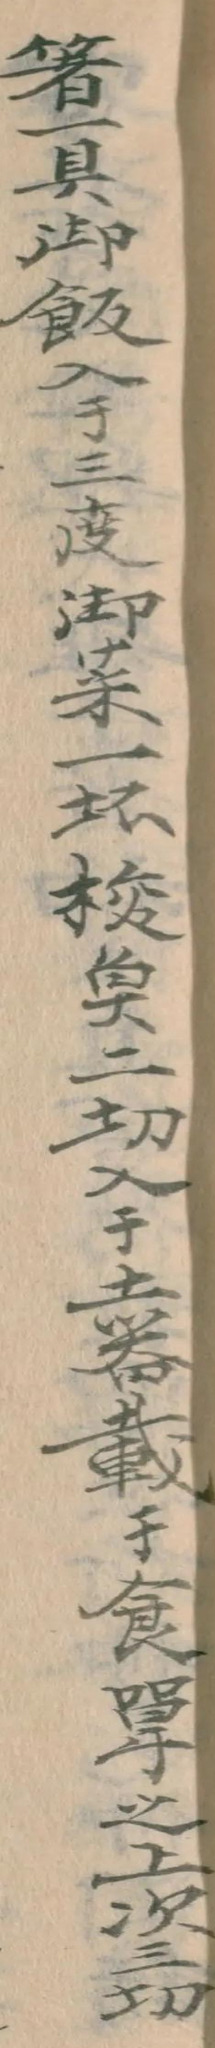著一具御飯入于三度御菜一坏梭魚二切入于土器載于食単之上次三切
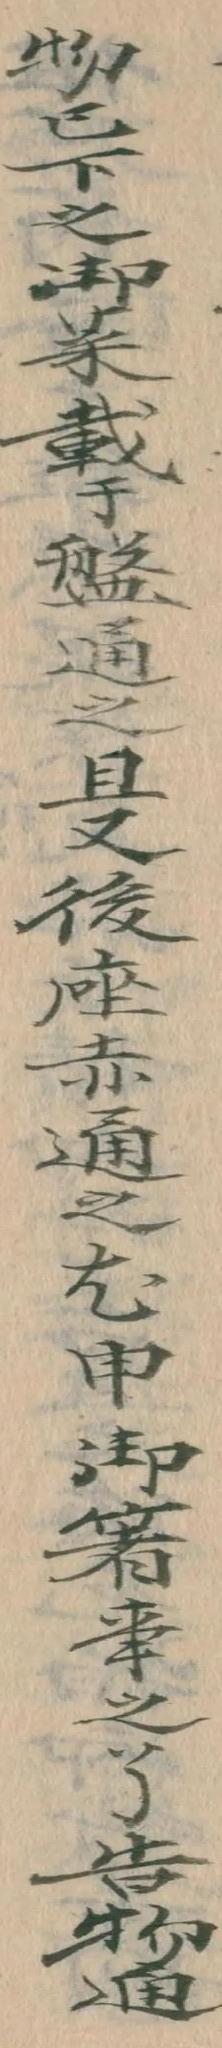物已下之御米載于盤通之且又後座赤通之尤申御箸事之了告物通
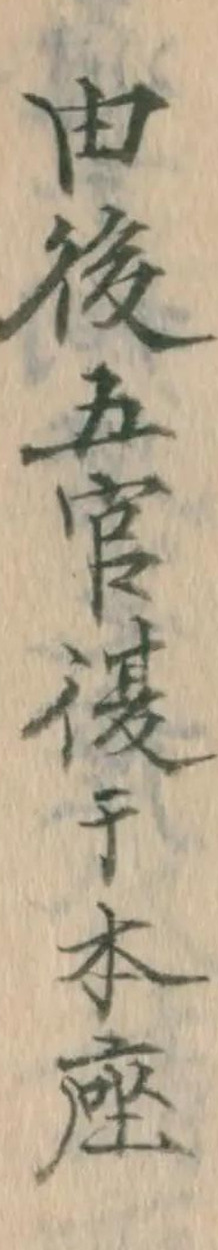由後五官復于本座
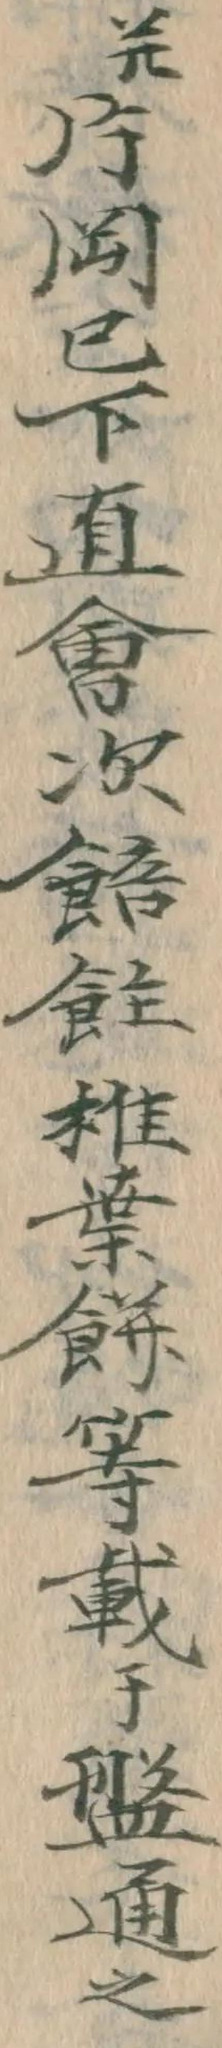并片岡已下直会次餢飳椎葉餅等載于盤通之
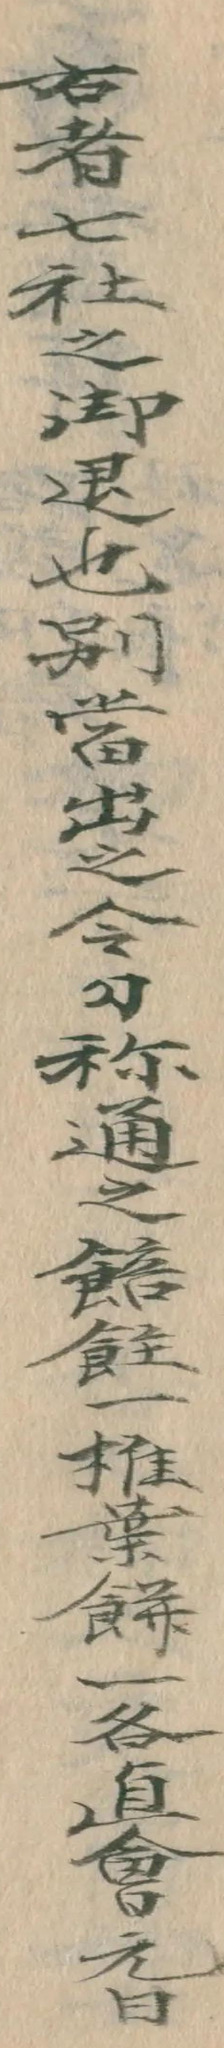右者七社之御退也別当出之令刀称通之餢飳一椎葉餅一各直会元日
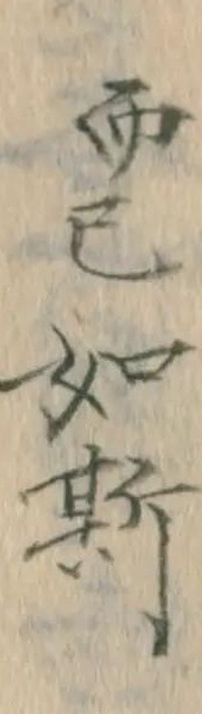而已如斯
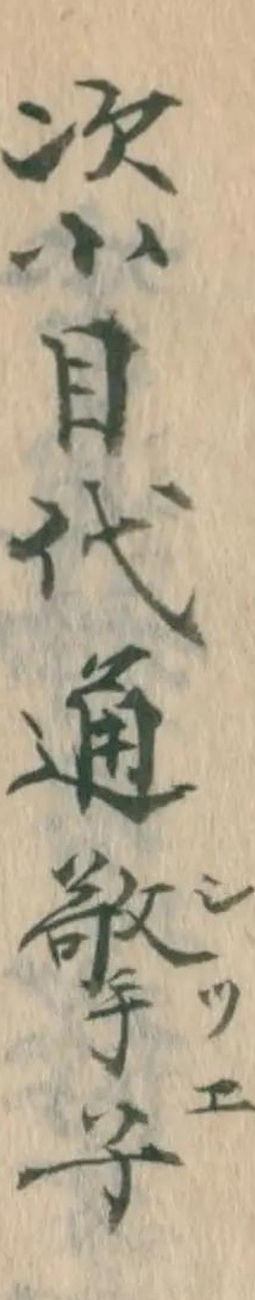次小目代通擎子
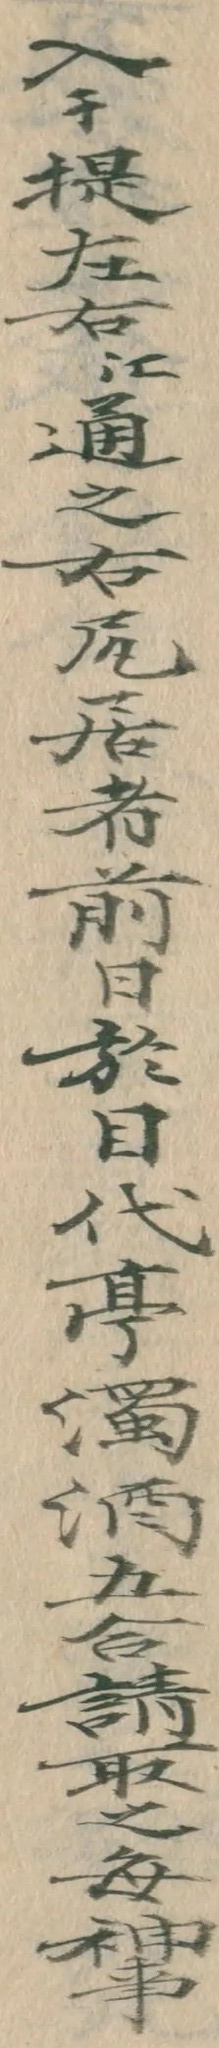入于提左右江通之右尻居者前日於目代亭濁酒五合請取之毎神事
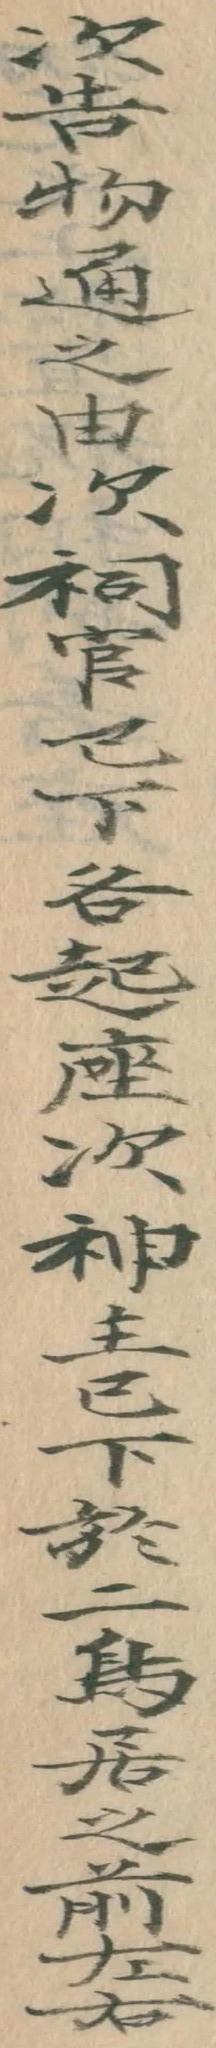次告物通之由次祠官已下各起座次神主已下於二鳥居之前左右

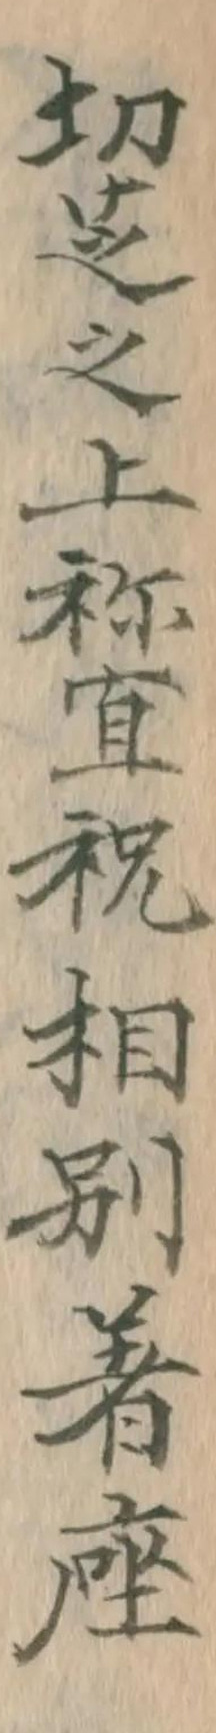切芝之上祢宜祝相別着座
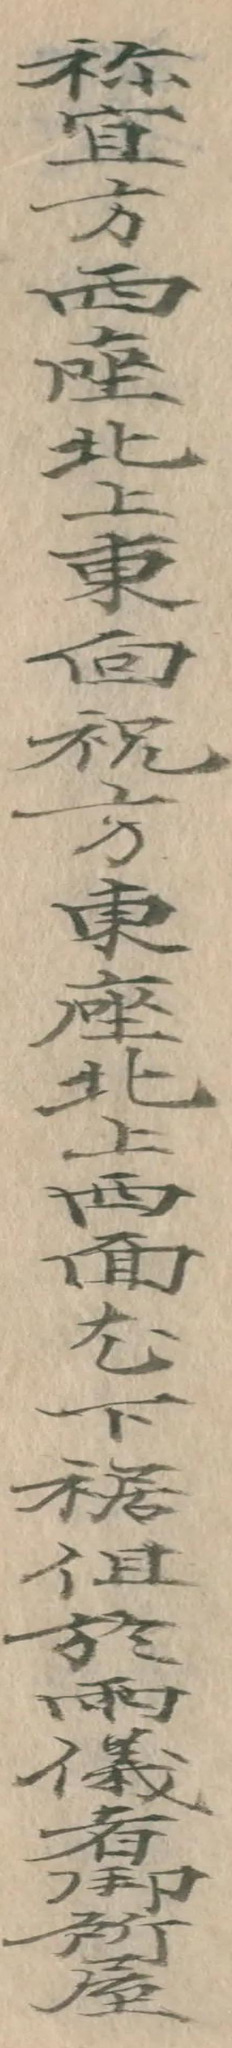祢宜方西座北上東向祝方東座北上西面尤下裾但於両儀者御所屋
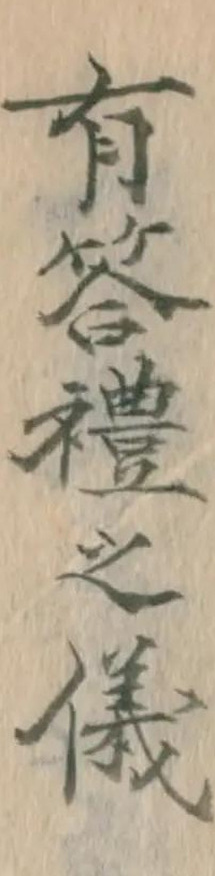有答礼之儀
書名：賀茂社記録. 第9冊
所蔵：国立国会図書館 National Diet Library, JAPAN
